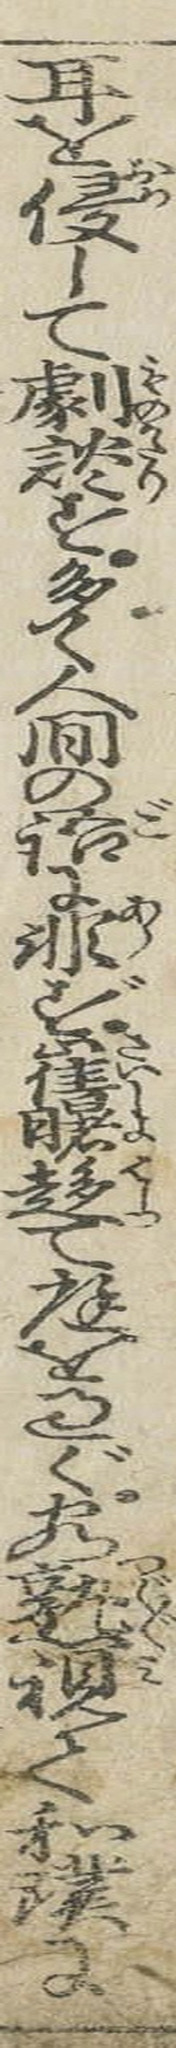耳を侵して劇談す。多く人間の語に非ず。摧曙移て庭を過ぐ。客熟視て和璞に
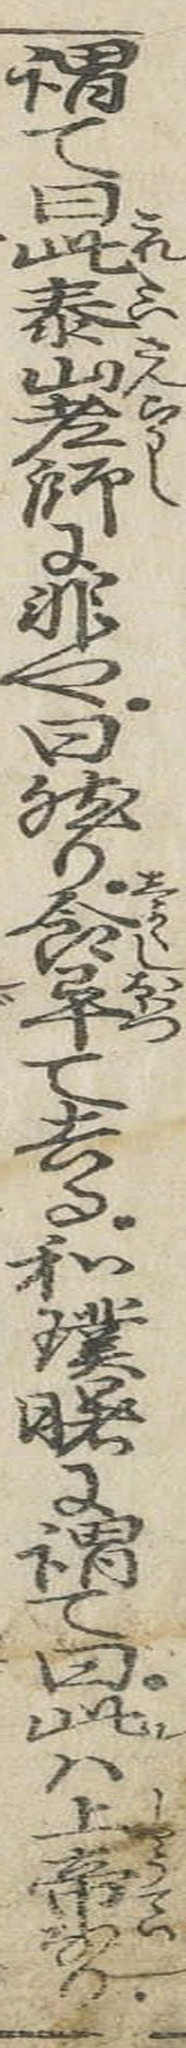謂て曰此泰山老師に非や。曰然り。食畢て去る。和璞曙に謂て曰。此は上帝なり。
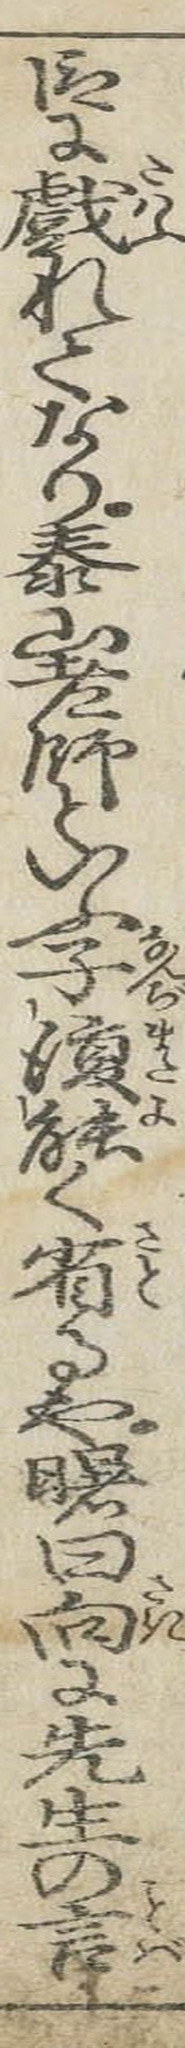臣に戯れてなり。泰山老師といふ子-復-能く省るや。曙曰向に先生の言
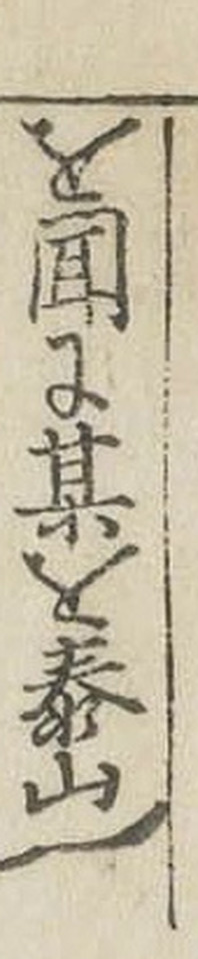を聞に某を泰山
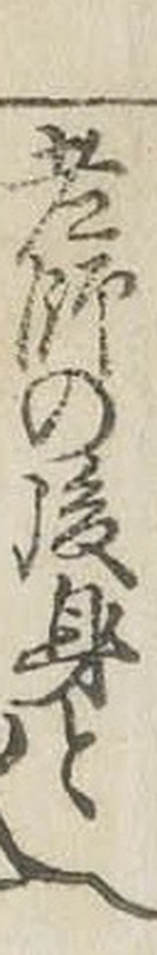老師の後身と
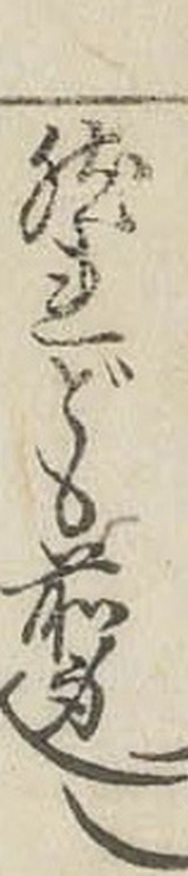然れども前身
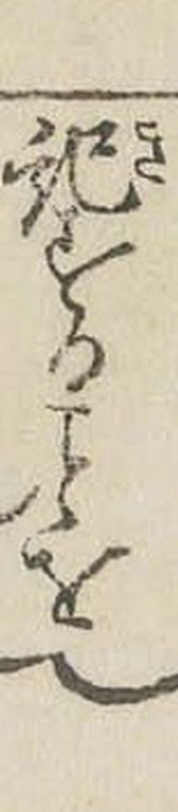記することを
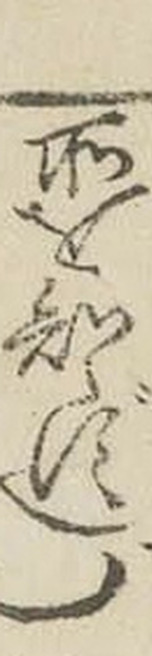所を知らず
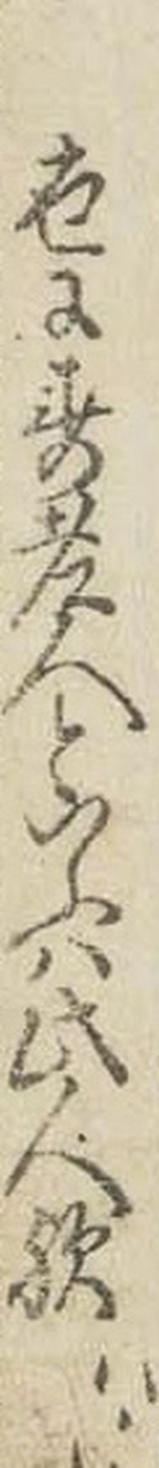世に寿老人といふは此人歟
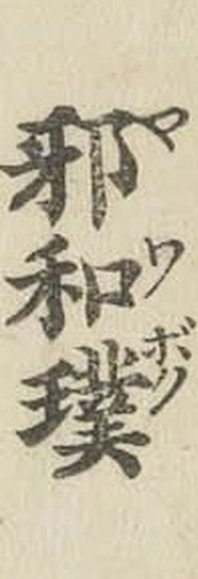邪和璞

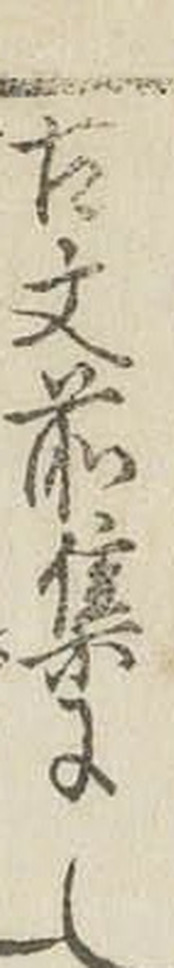古文前集に
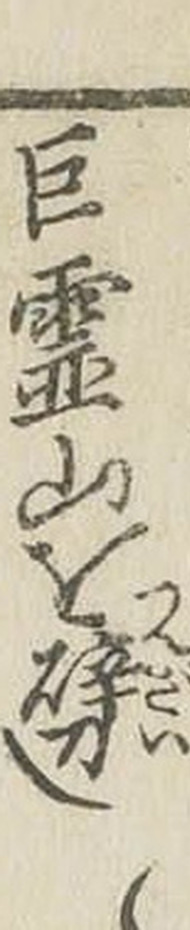巨霊山を劈
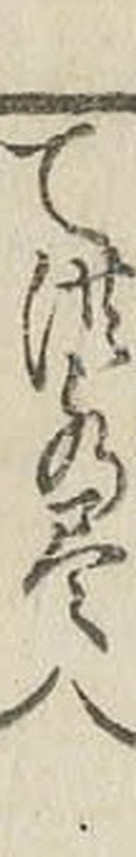て洪水尽
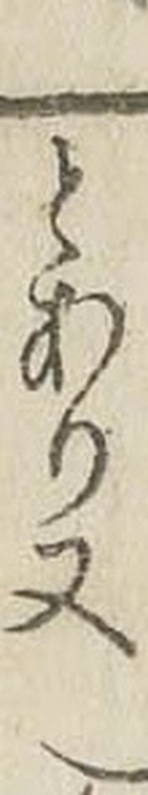とあり又
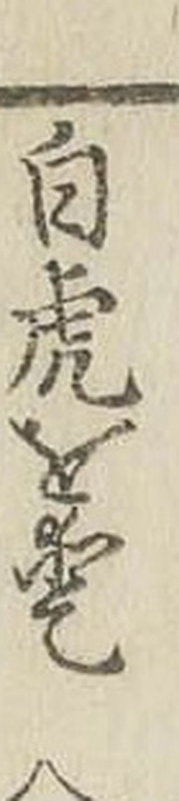白虎を愛
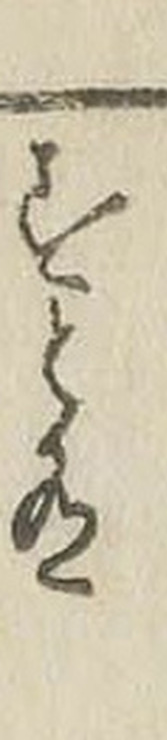すと有
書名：絵本写宝袋 9巻 7之巻
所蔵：東京学芸大学教育コンテンツアーカイブ
